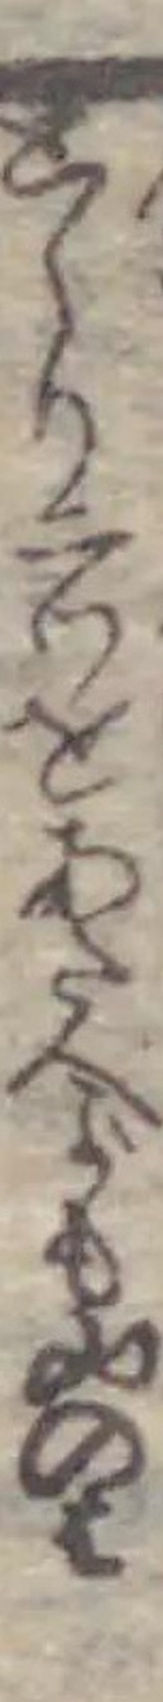とくり二ツをあたへよも山のは
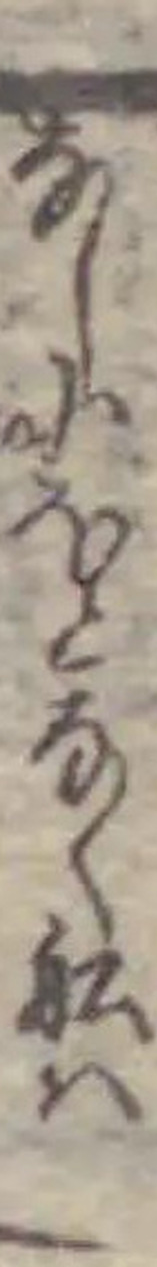なしにほとなく船は
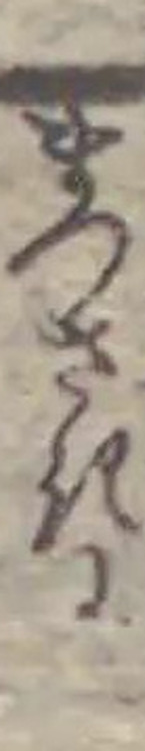まつさきに
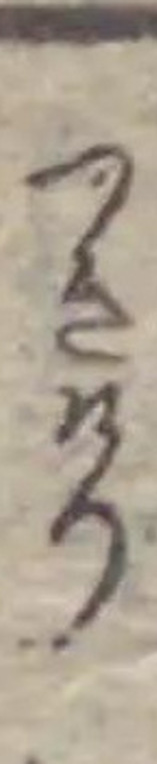つきけり
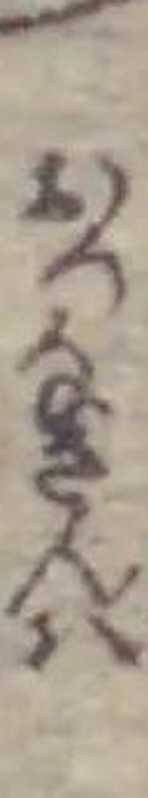おつなさんは
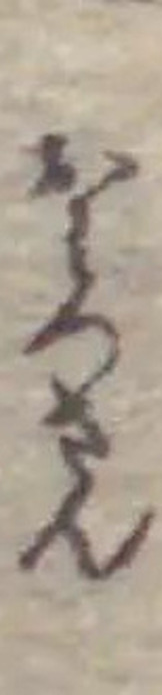おみつさん
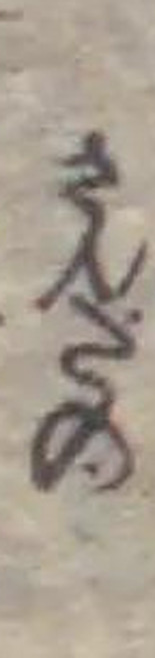さんたの
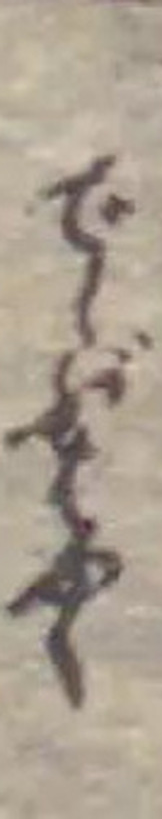でえぶはやく
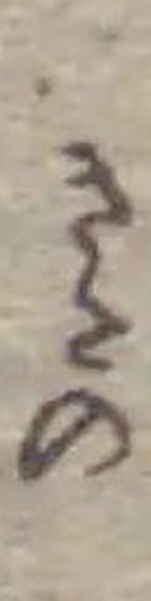きたの

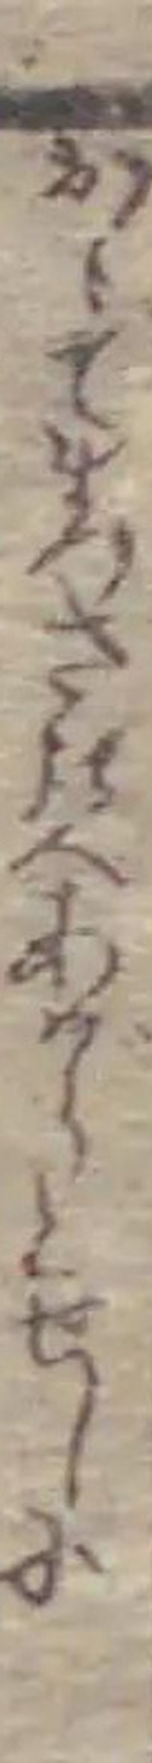かくてまつさきへあがりとせしに
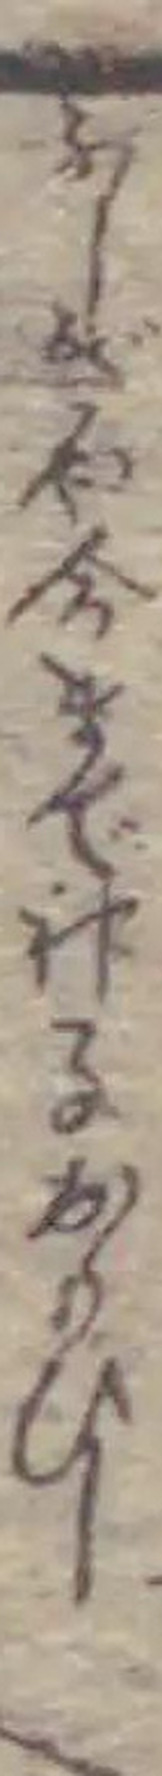ふしぎや今まで神子おもひし
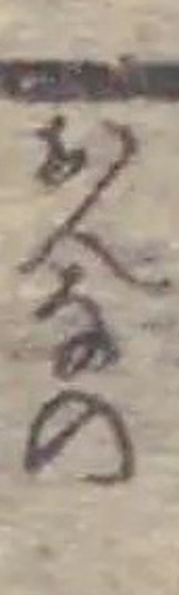おんなの
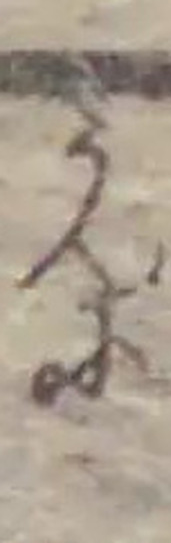うんに
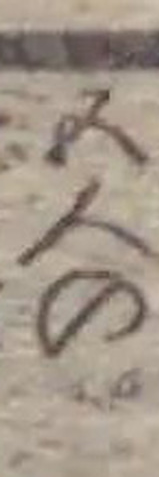五人の
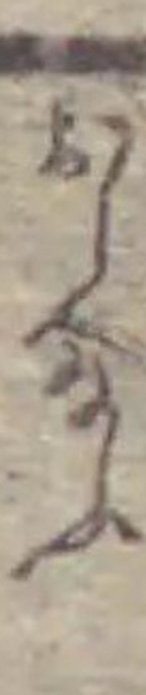おしへ給ふ
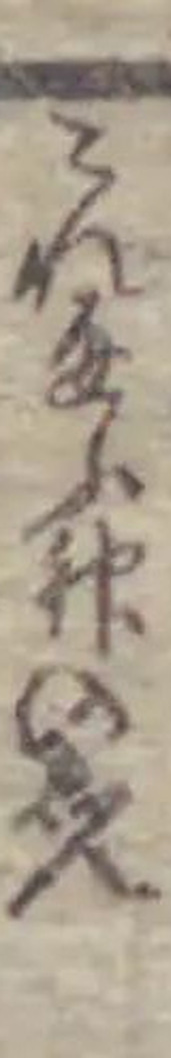これ通ふ神のしん
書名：藝者五人娘 2巻
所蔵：国立国会図書館 National Diet Library, JAPAN
